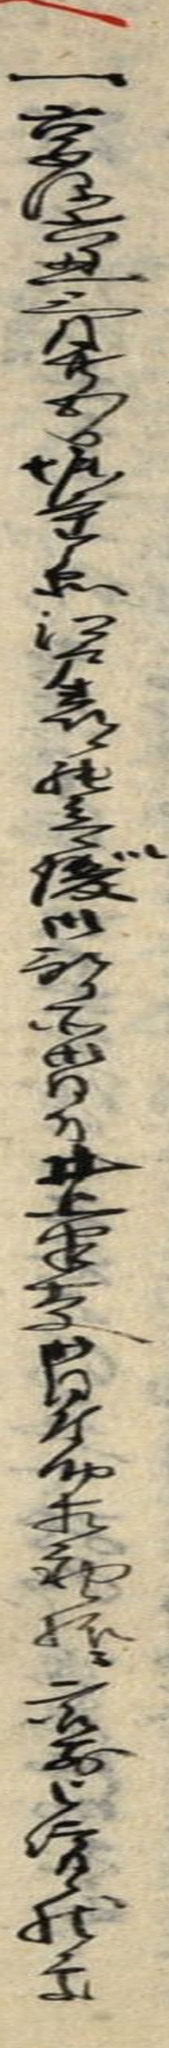一享保六丑三月廿五日堀重兵衛江戸表へ罷立候以後御預り所御目付井上半太夫御目付助相勤候様に最前被仰付候然処

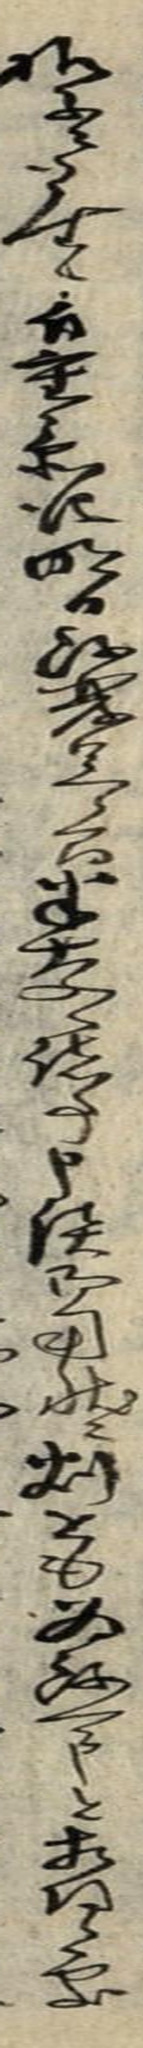様子に御座候に付重兵衛儀明日致発足候間半太夫へ諸事申談御用状に判とも為致可申と相伺候処
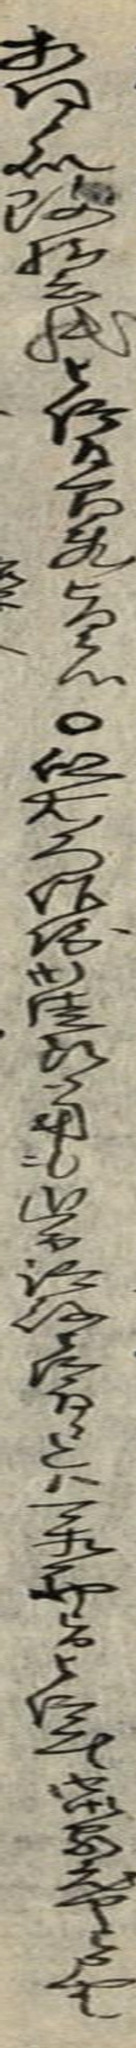相伺候処改誓紙被仰付間敷旨に候○但右衛門作儀御徒頭御用も追而跡役被仰付候迄は可相勤候旨被仰出候由御家老中被申聞候
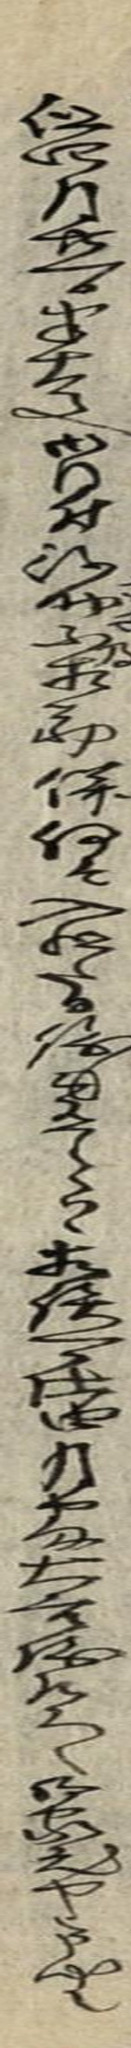但四月廿一日半太夫御目付役助最早不及相勤併何も入組たる儀出有之候はゝ相談可仕由月番大谷儀左衛門へ御家老中被申聞候
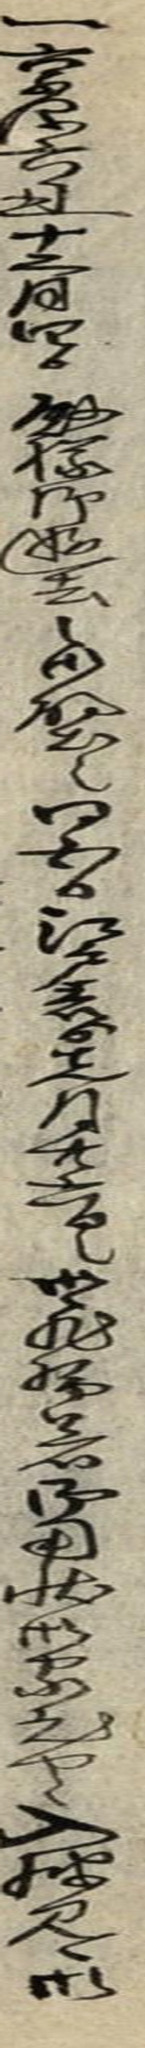一享保六丑十二月四日殿様御逝去之御触出之同五日江戸表ゟ先月廿六日之御飛脚着御用状御家老中へ入披見候御
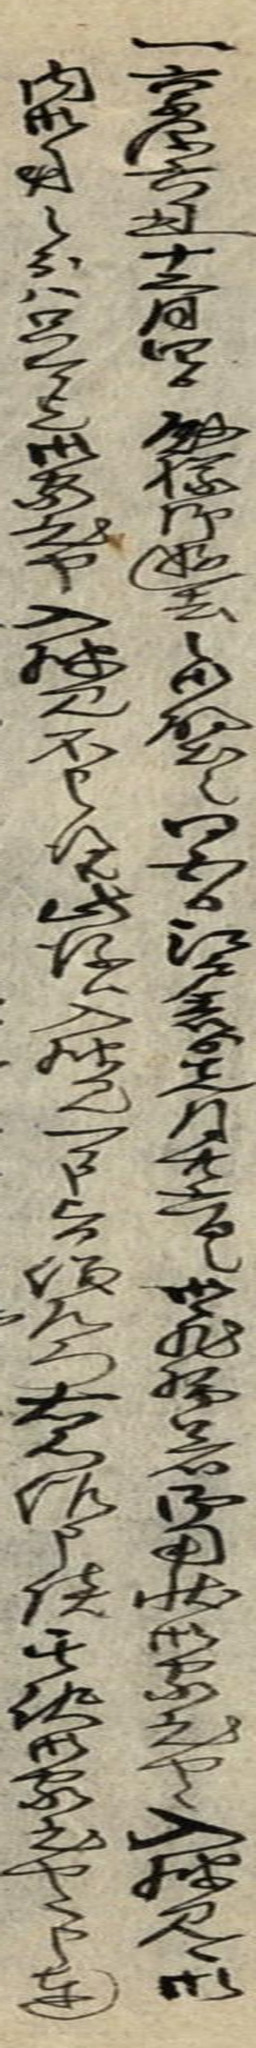内御用之分は只今迄御家老中入披見不申候得共此後は入披見可申旨儀左衛門右衛門作申談其訳御家老中へ申達
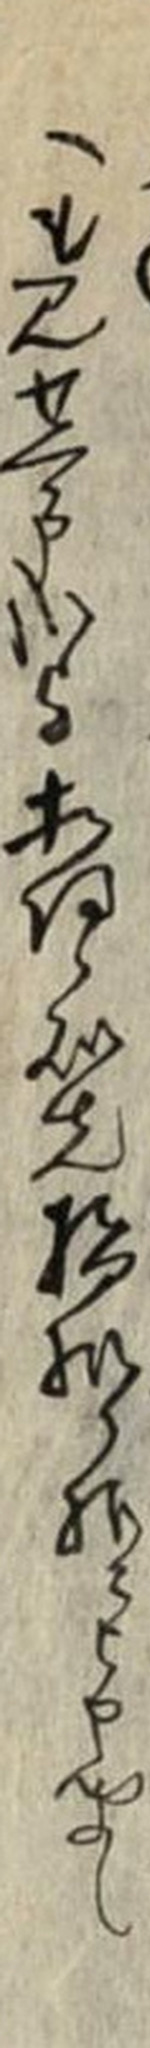へも見せ可申哉与相伺候処先指掛候様に被申聞候
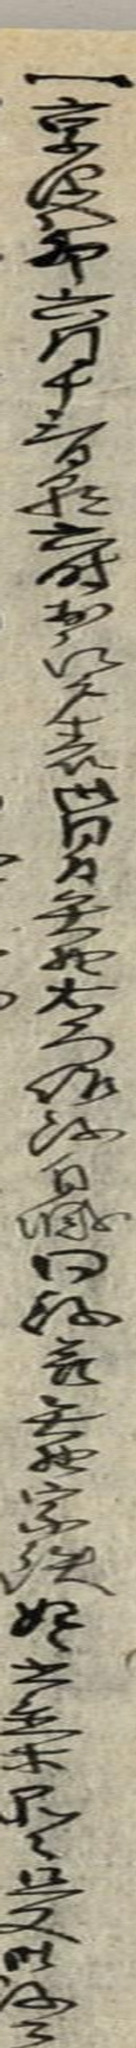一享保八卯六月十三日朝六時於江戸表御目付矢野右衛門作自滅同役并矢野宗鉄始へ書置等品々且又御役に相用候印判等
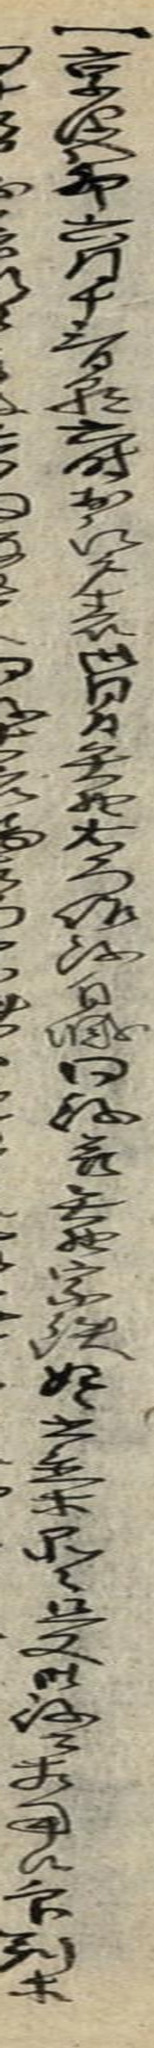一享保八卯六月十三日朝六時於江戸表御目付矢野右衛門作自滅同役并矢野宗鉄始へ書置等品々且又御役に相用候印判等
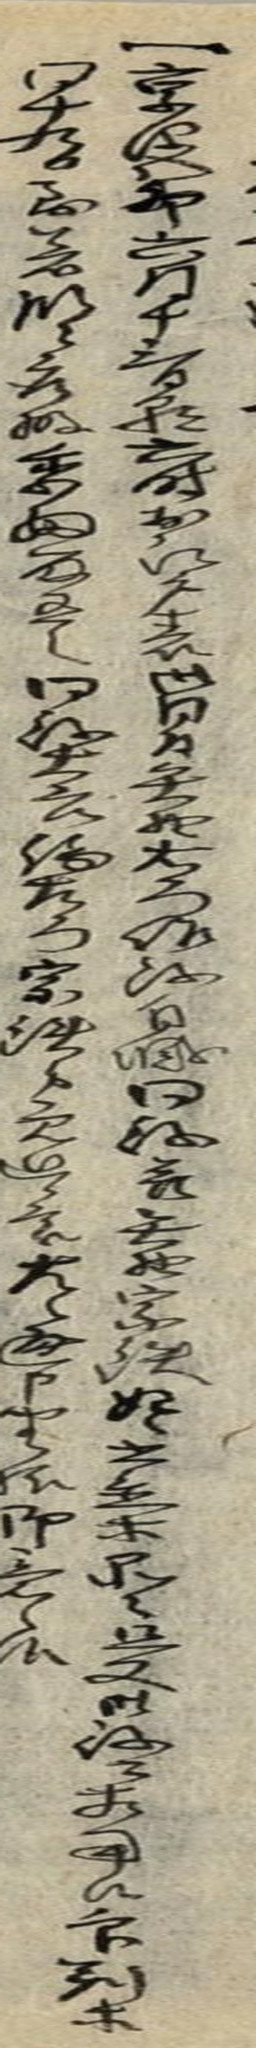同十九日到着段々取扱委細留有之同役大谷儀左衛門宗鉄方へ見廻候節左之通申聞候様御意之趣
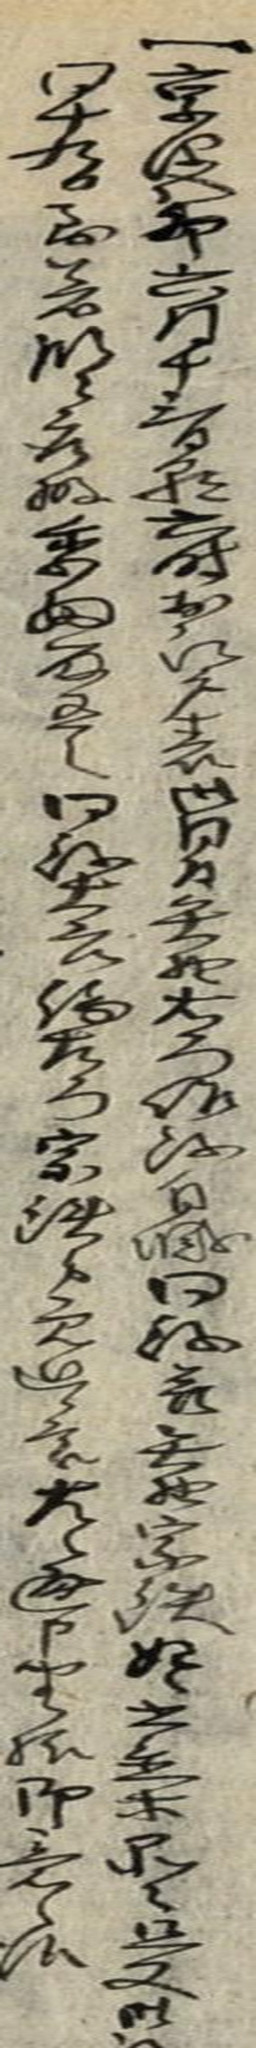同十九日到着段々取扱委細留有之同役大谷儀左衛門宗鉄方へ見廻候節左之通申聞候様御意之趣
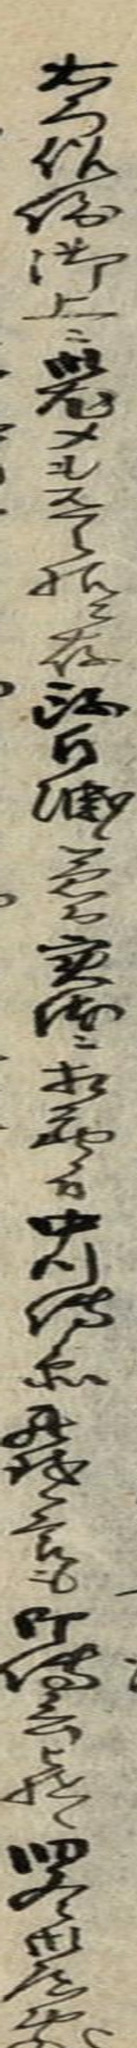右衛門作儀御上に御尤メも有之様に存致自滅候兼而実体に相勤候付中川伝兵衛罷越候節も御伝言被遊候旧冬御屋敷
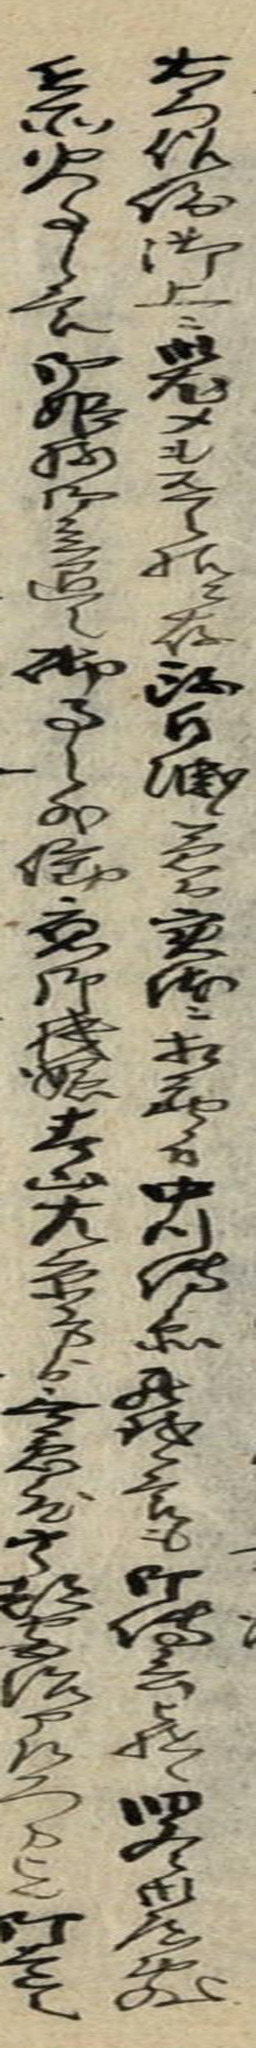近所火事之節御姫様御立退之砌事之外働応御機嫌青山左京方ゟ無急度宇都宮治部左衛門方迄御意之
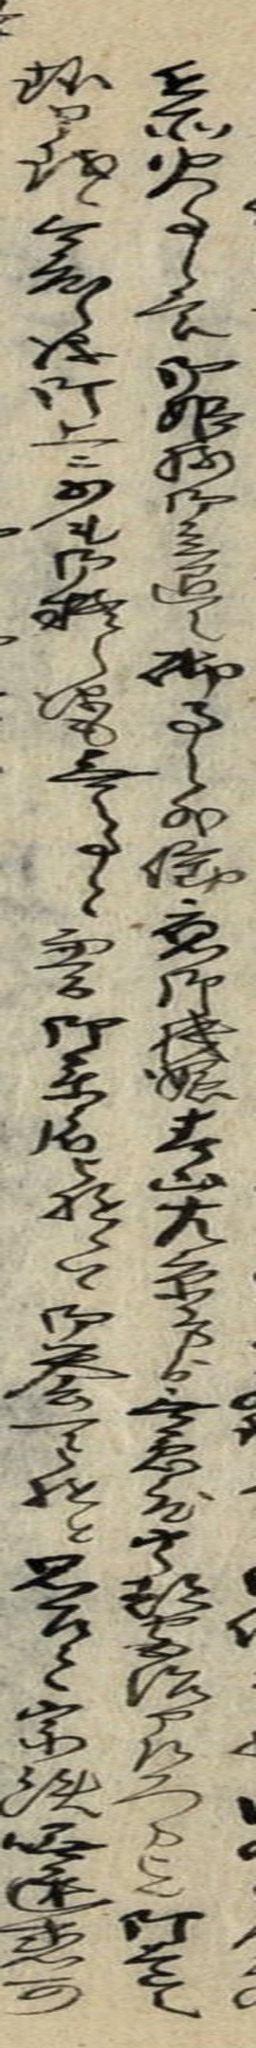趣申越候今度之儀御上に少も御疑之儀も無之事に候兼而御参詣被遊候はゝ御誉可被遊と思召候宗鉄嘸迷惑可
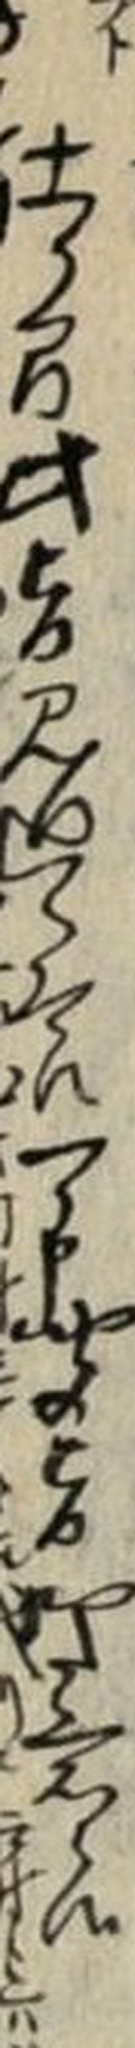仕候間此旨見廻候節可申聞旨御意に候
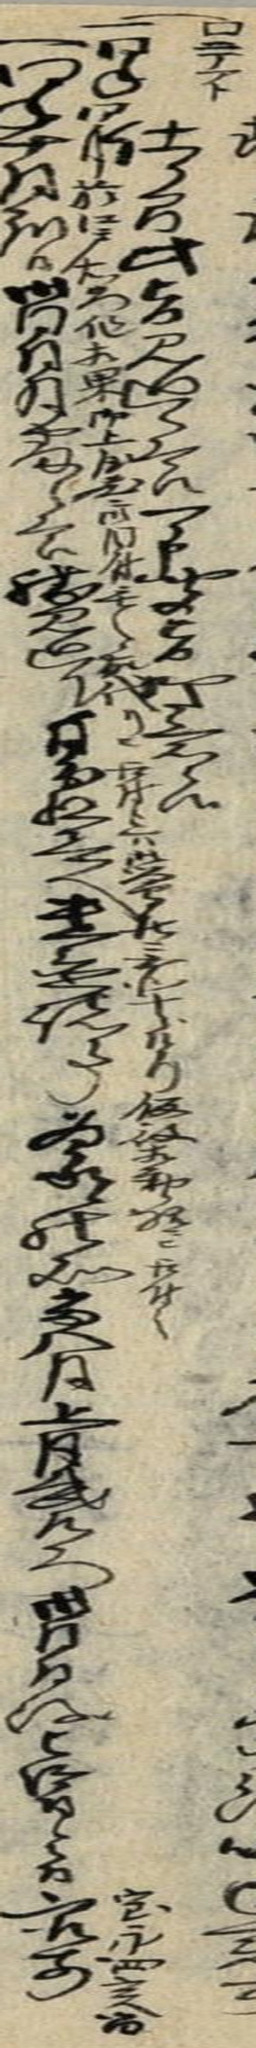一同年十月朔日御目付月番之節勝見廻り自分組壱人遣置諸事為承候然処
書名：蒐輯之部
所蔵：福井県文書館 Fukui Prefectural Archives
